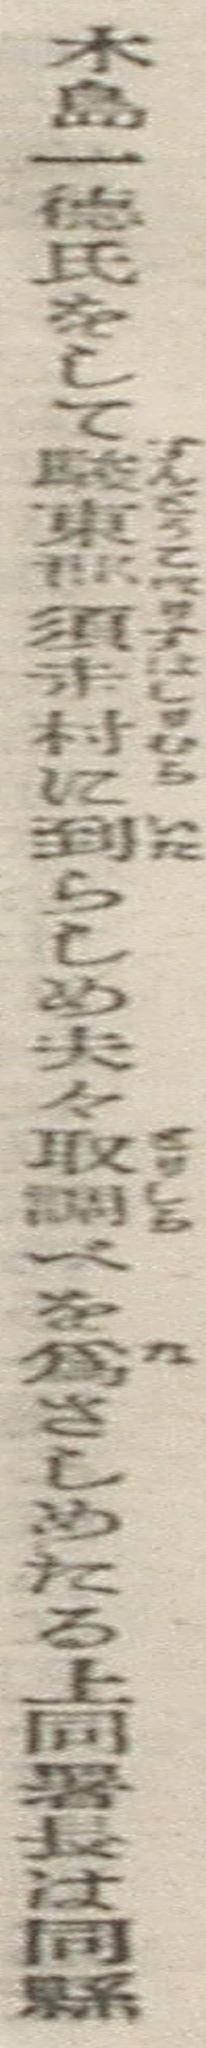水島一徳氏をして駿東郡須走村に到らしめ夫々取調べを為さしめたる上同署長は同縣
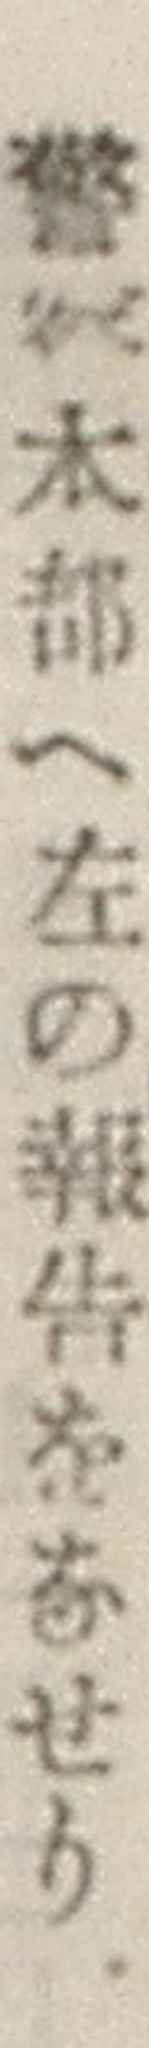警察本部へ左の報告をなせり
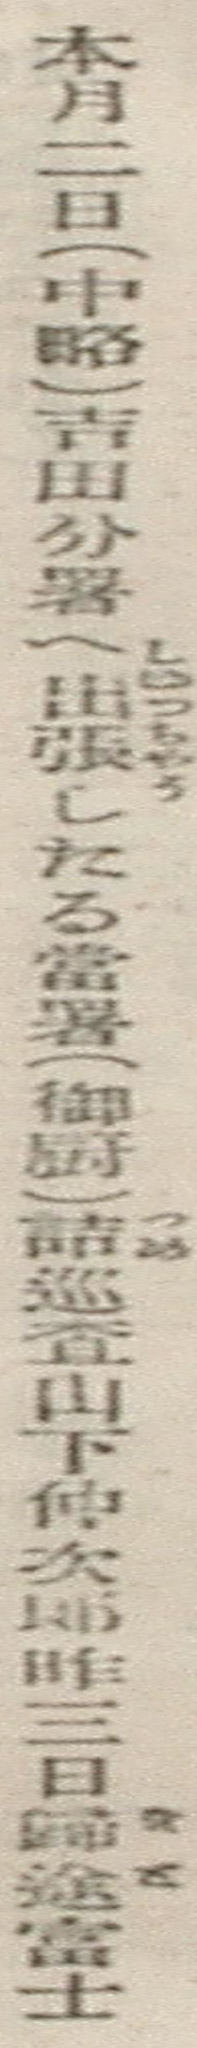本月二日吉田分署へ出張したる當署詰巡査山下仲次郎昨三日歸途冨士
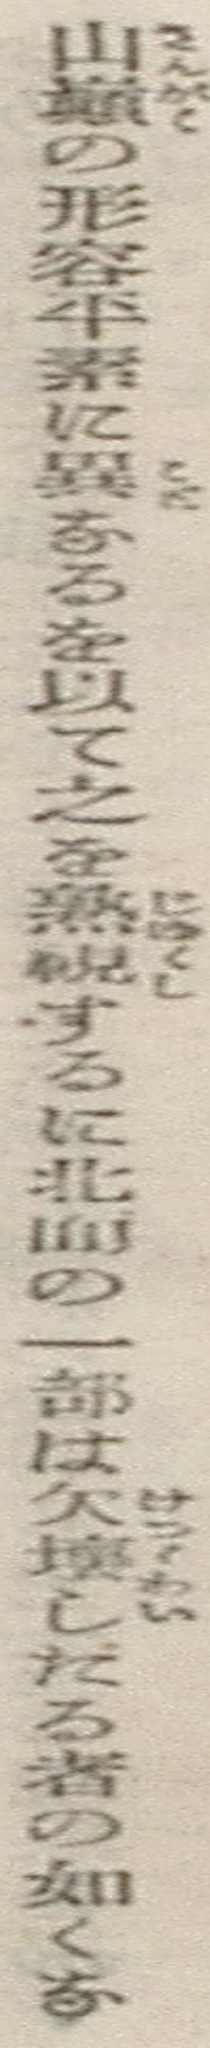山巓の形容平素に異なるを以て之を熟視するに北面の一部は欠壊したる者の如くな
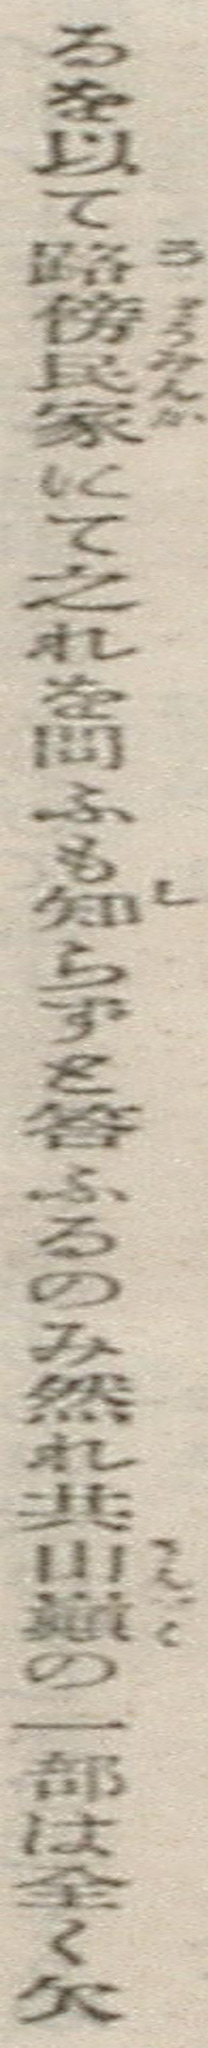るを以て路傍民家にて之れを問ふも知らずと答ふるのみ然れ共山巓の一部は全く欠
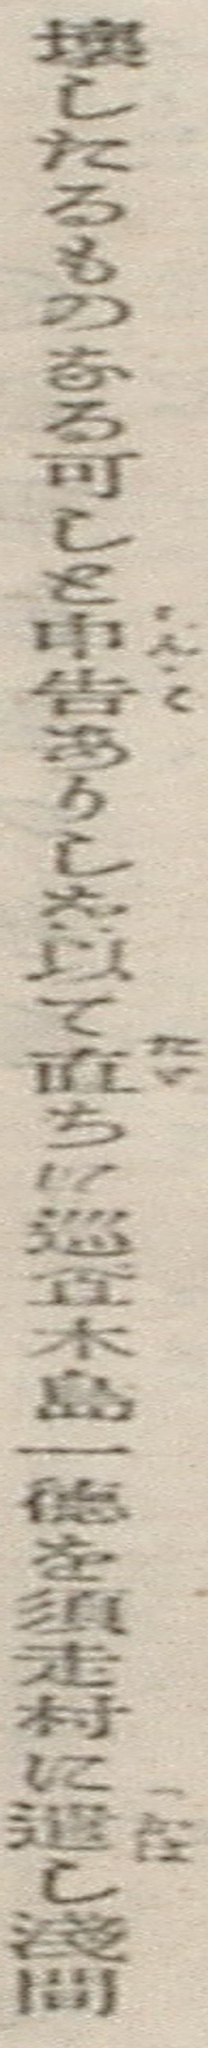壊したるものなる可しと申告ありしを以て直ちに巡査木島一徳を須走村に遣し浅間
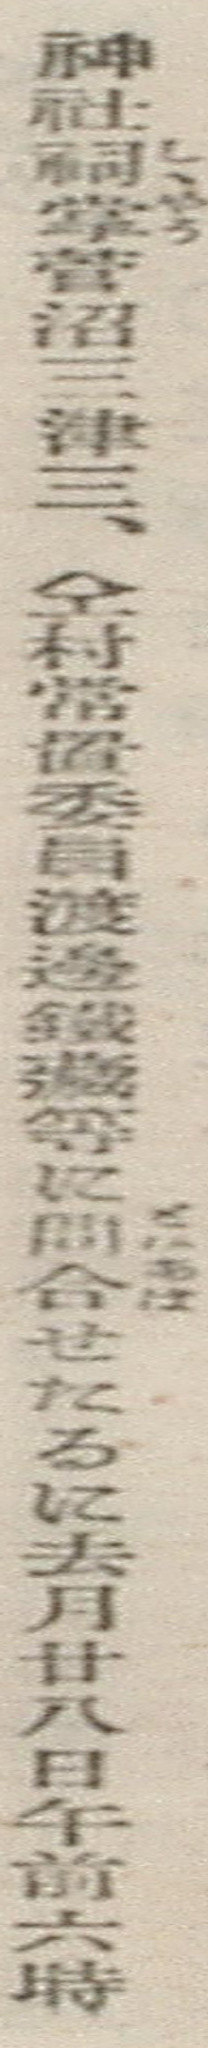神社祠掌菅沼三津三、仝村常置委員渡邊鐡蔵等に問合せたるに去月廿八日午前六時
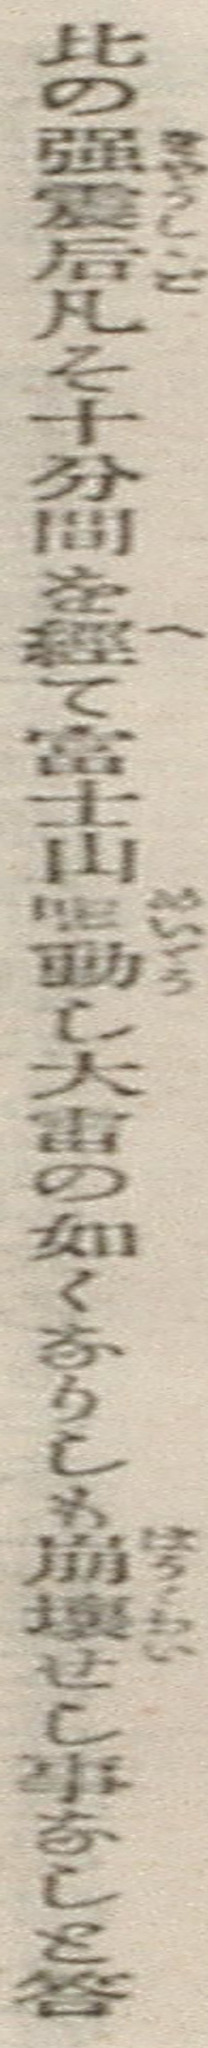此の強震后凡そ十分間を經て富士山鳴動し大雷の如くなりしも崩壊せし事なしと答
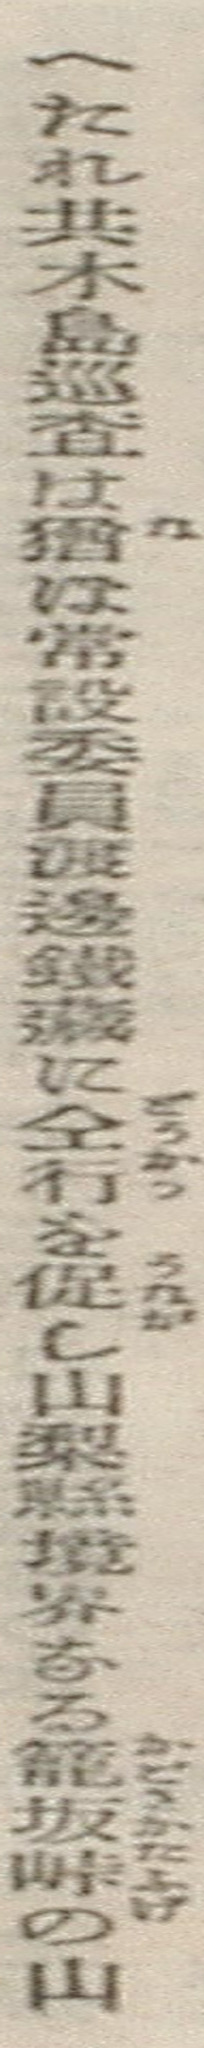へたれ共木島巡査は猶ほ常設委員渡邊鐡蔵に仝行を促し山梨縣境界なる籠坂峠の山
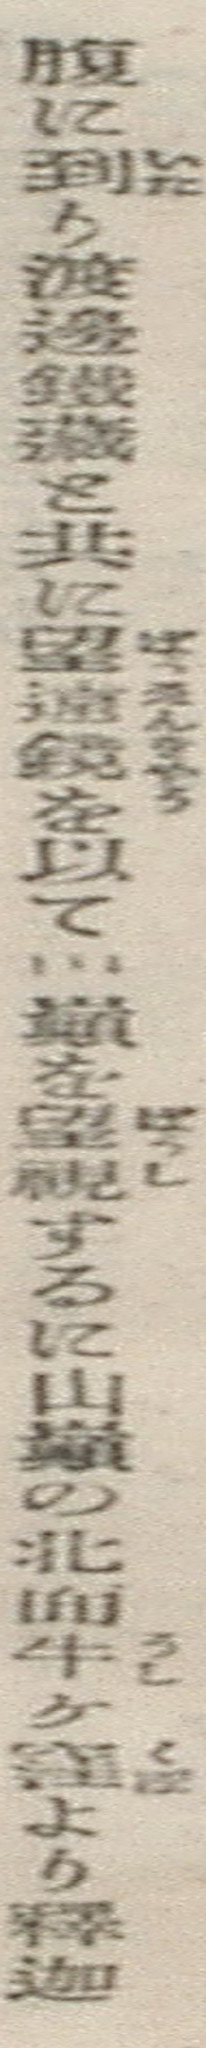腹に至り渡邊鐡蔵と共に望遠鏡を以て山巓を望視するに山巓の北面牛ヶ窪より釋迦
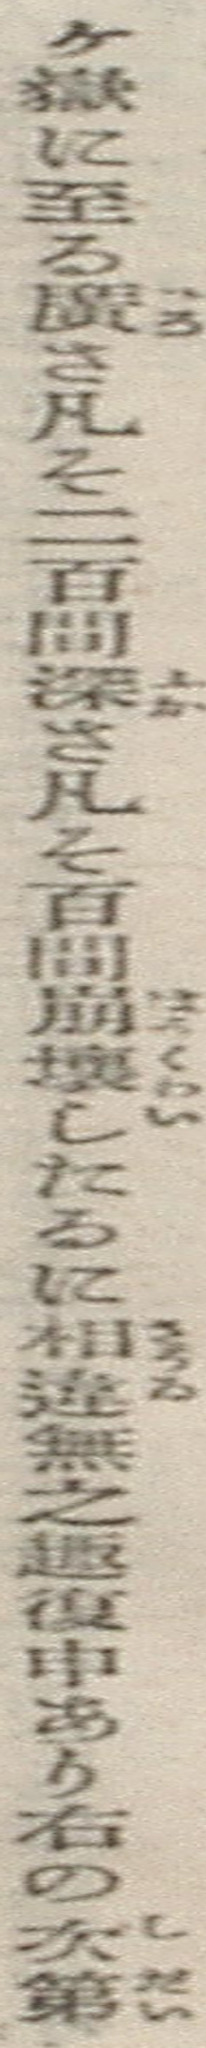ヶ嶽に至る廣さ凡そ二百間深さ凡そ百間崩壊したるに相違無之趣復申あり右の次第
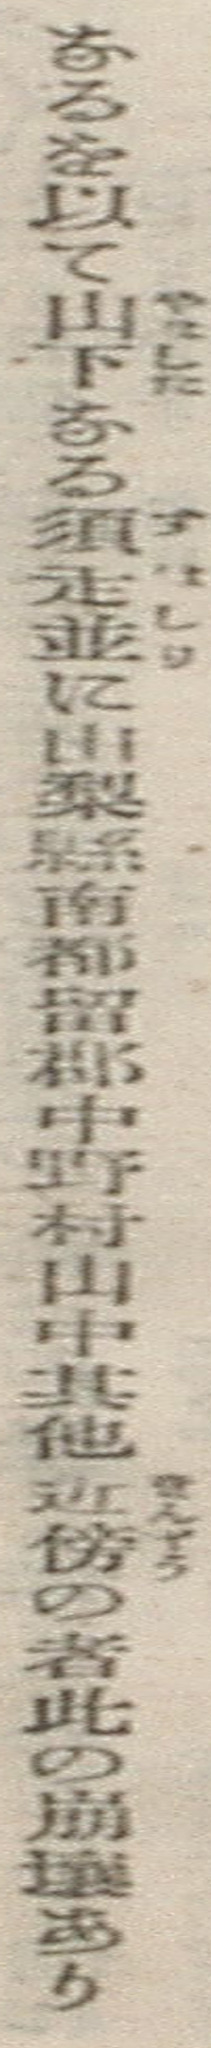なるを以て山下なる須走並に山梨縣南都留郡中野村山中其他近傍の者此の崩壊あり
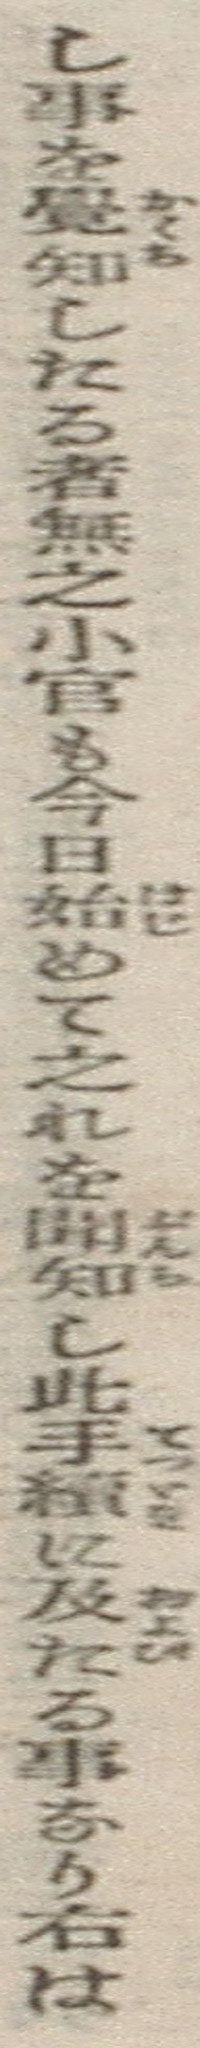し事を覺知したる者無之小官も今日始めて之れを聞知し此手續に及たる事なり右は
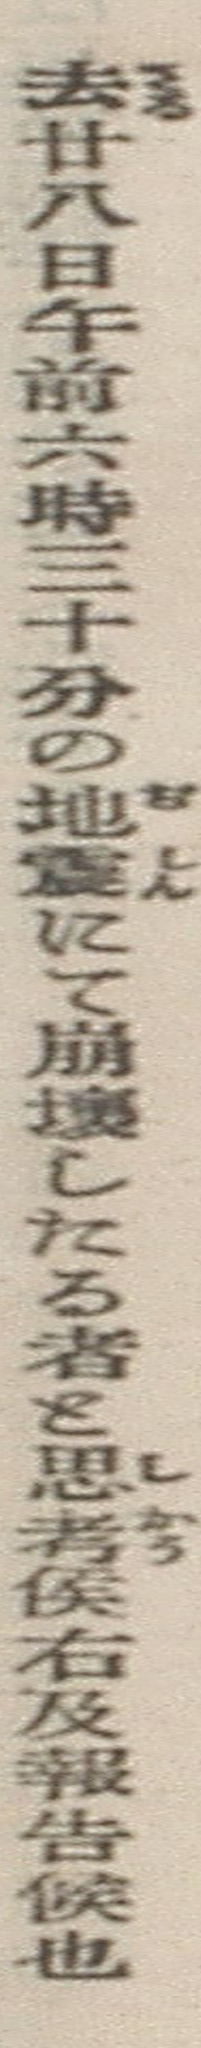去廿八日午前六時三十分の地震にて崩壊したる者と思考候右報告候也
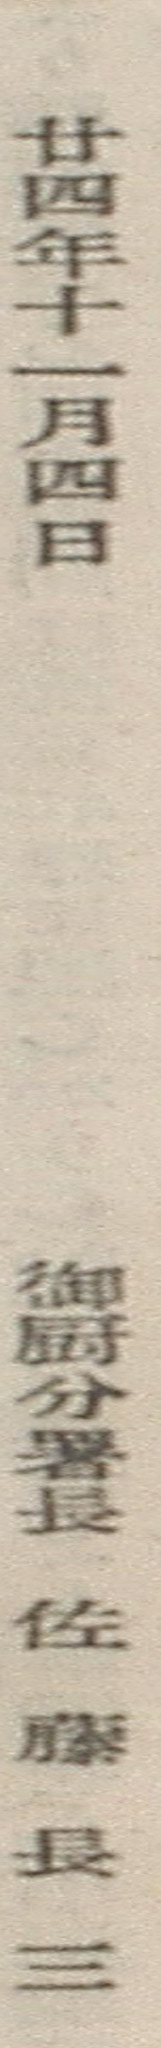廿四年十一月四日御厨分署長佐藤長三
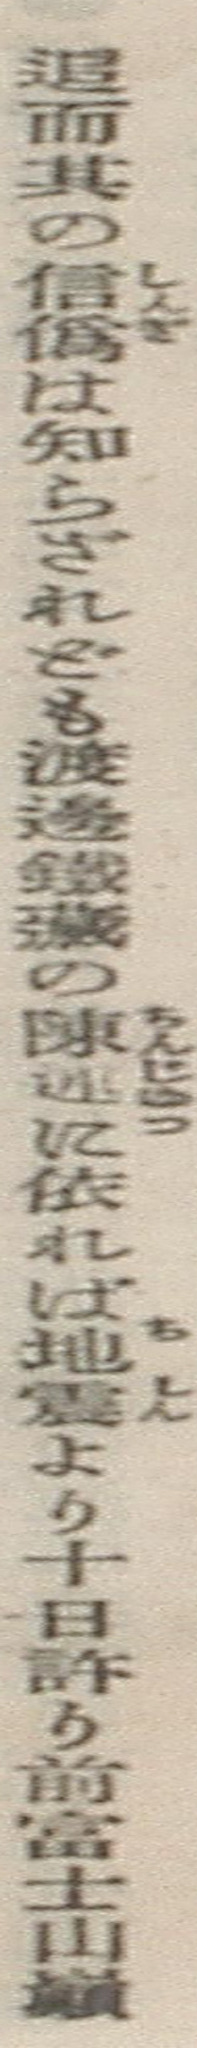追而其の信偽は知らざれども渡邊鐡蔵の陳述に依れば地震より十日許り前冨士山巓
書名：愛知岐阜福井三県　大地震見聞録（内題）
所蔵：東京大学地震研究所図書室 Earthquake Research Institute Library, The University of Tokyo, JAPAN
